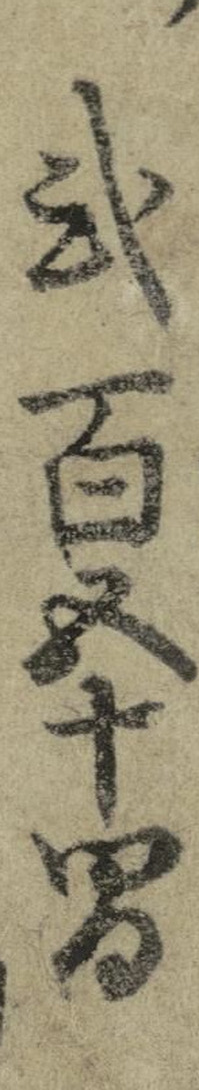二百五十間
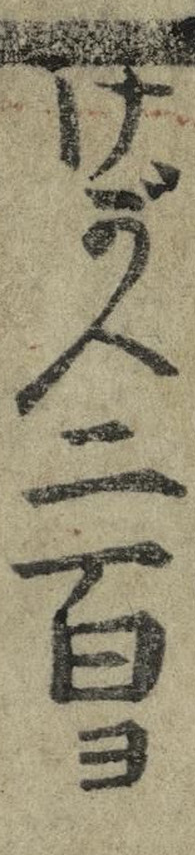けが人二百ヨ
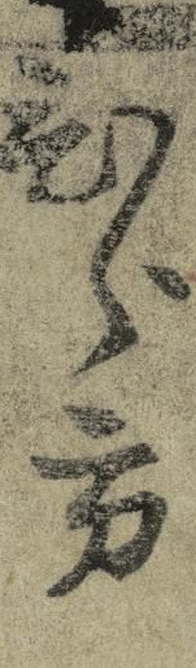ひら方
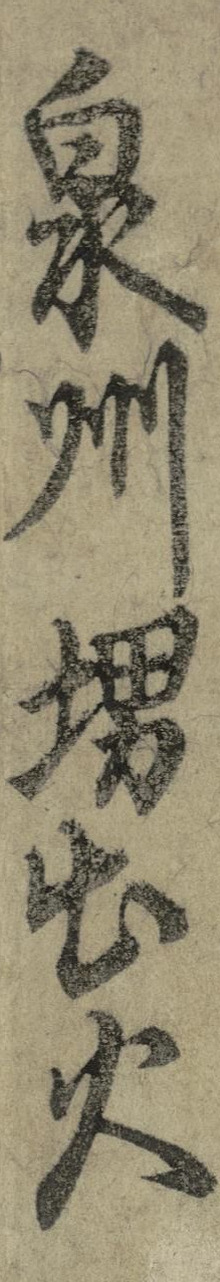泉州堺出火
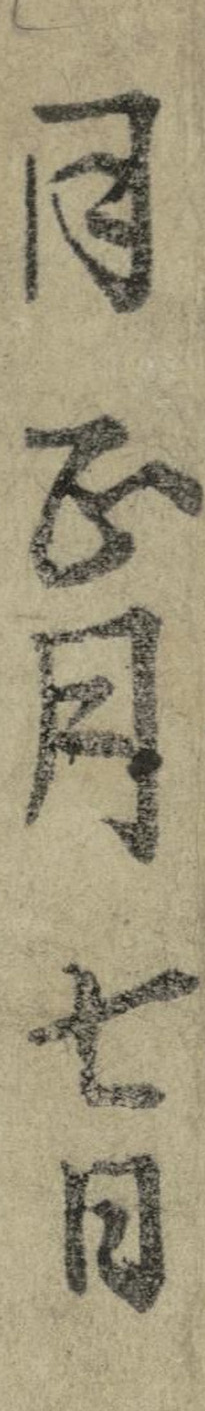同正月七日
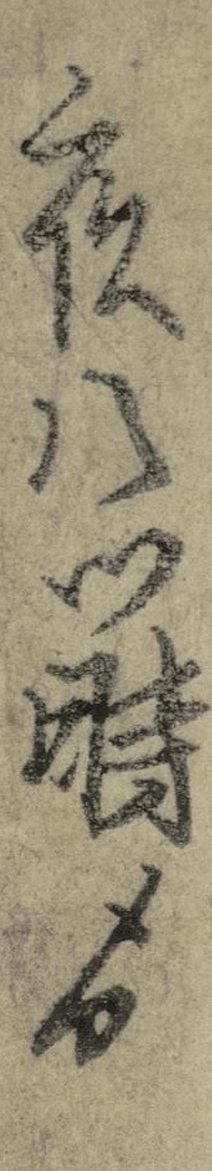夜八ツ時ゟ
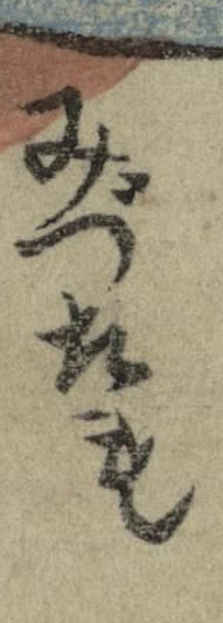みづたも
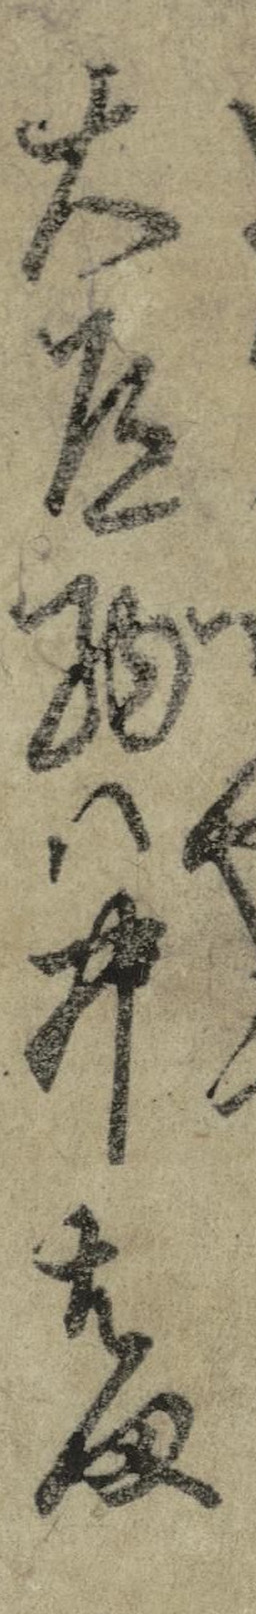大道西ハ中はま
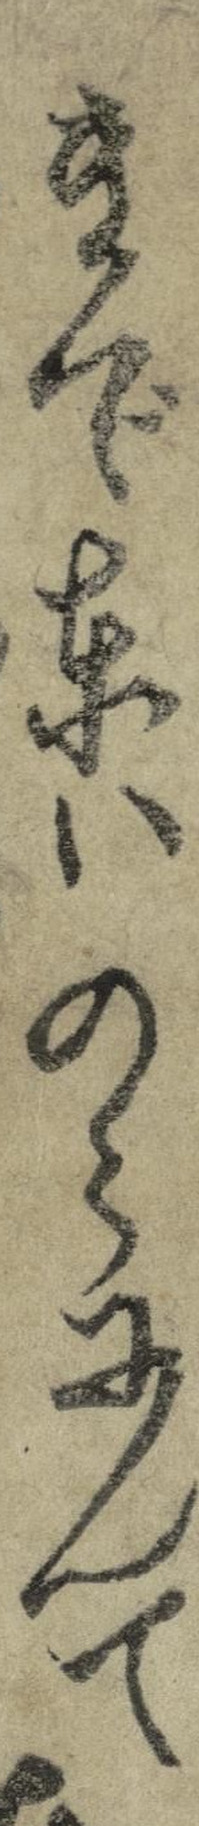まで東はのうにんて
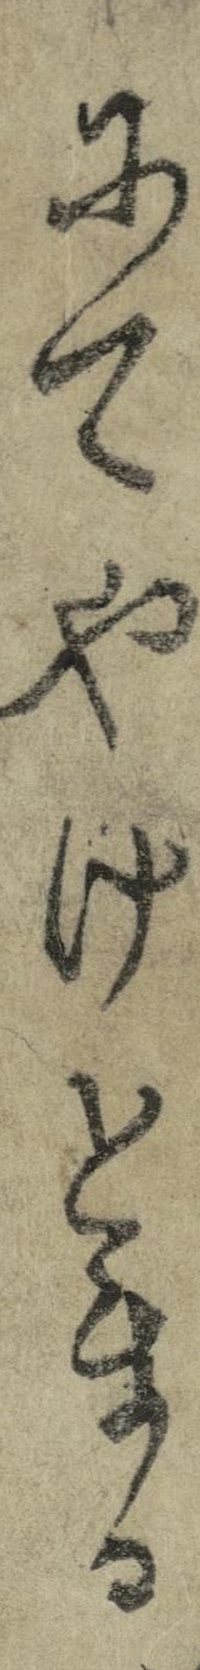にてやけとまる
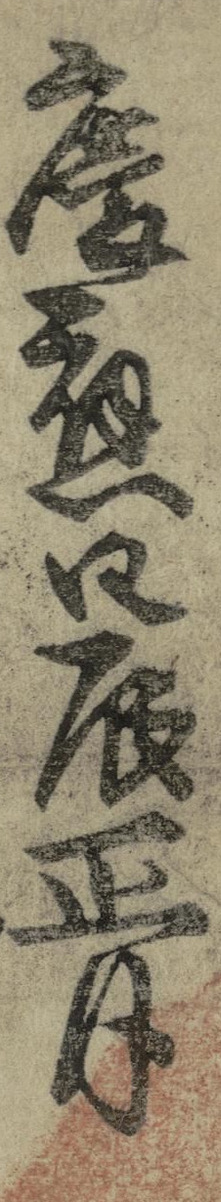慶應四辰正月
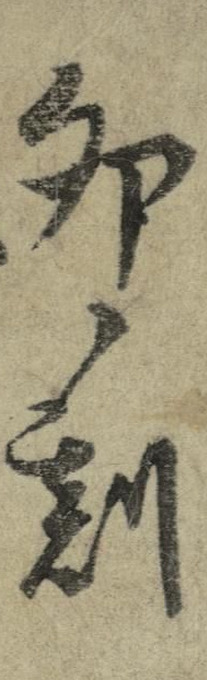卯ノ刻
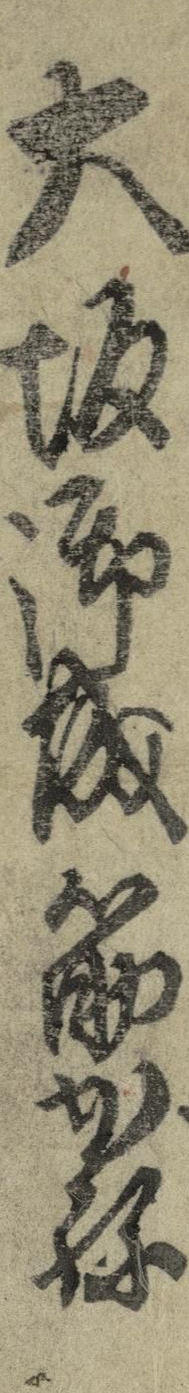大坂御城筋がね
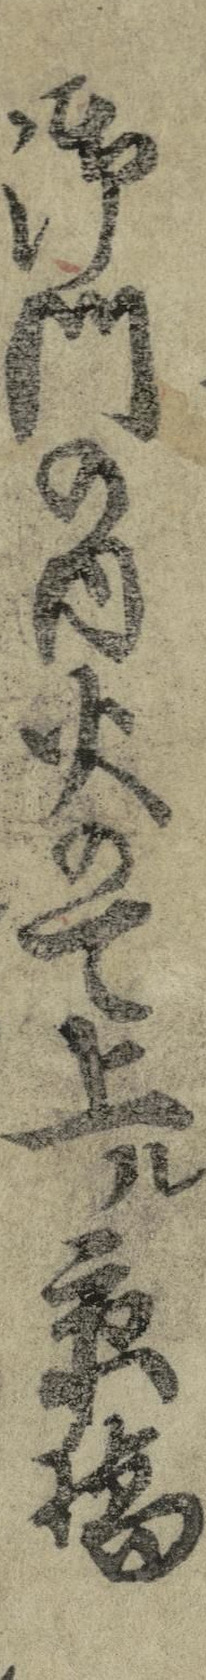御門の内火のて上ル京橋
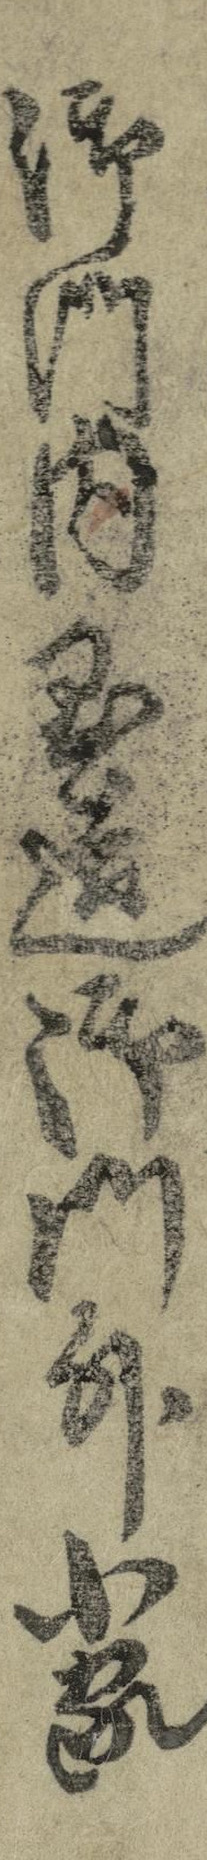御門内玉造御門外小家
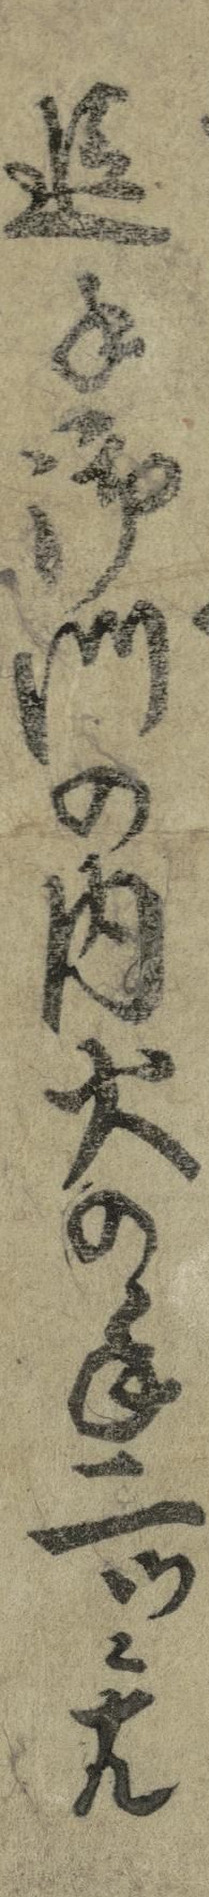追手御門の内火の手二ツニナル
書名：淀川大坂堺大火細見本しらべ
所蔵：東京大学地震研究所図書室 Earthquake Research Institute Library, The University of Tokyo, JAPAN
